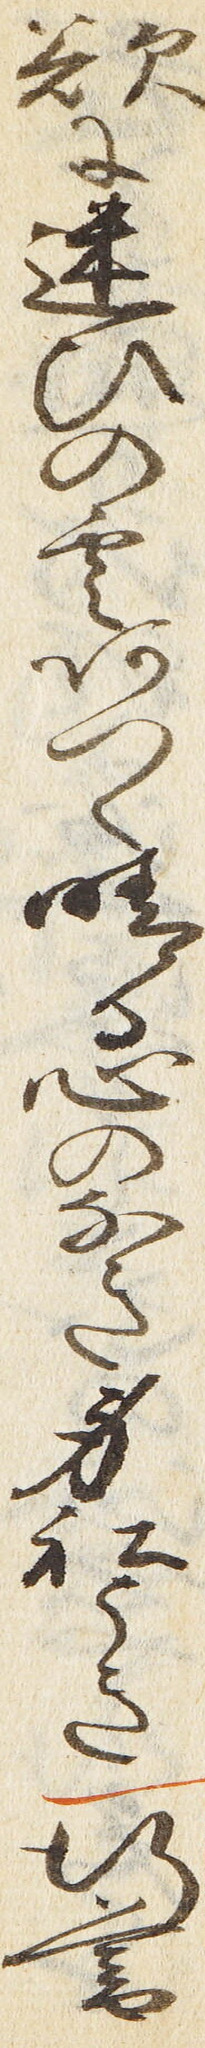欲に迷ひの雲あつく晴る心のなき身社うき「行暮
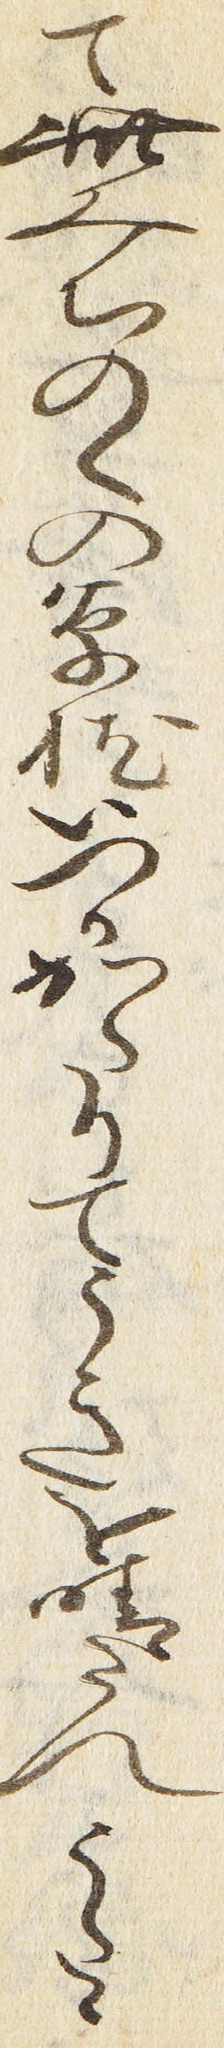て此みちのくの草枕いつかかたりてうきを晴さんうたゝ
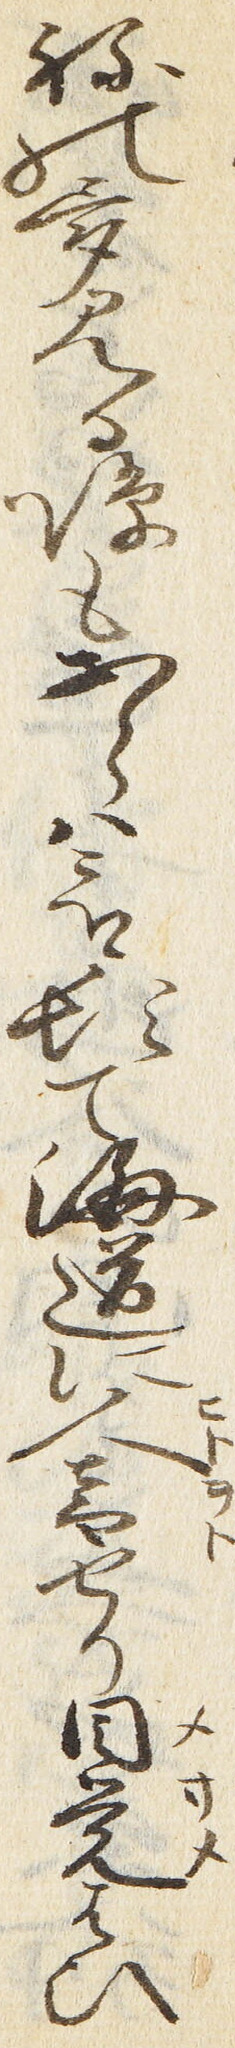ねの夢見る隙もあらハこそ頓て海道に人音せり目覚はひ
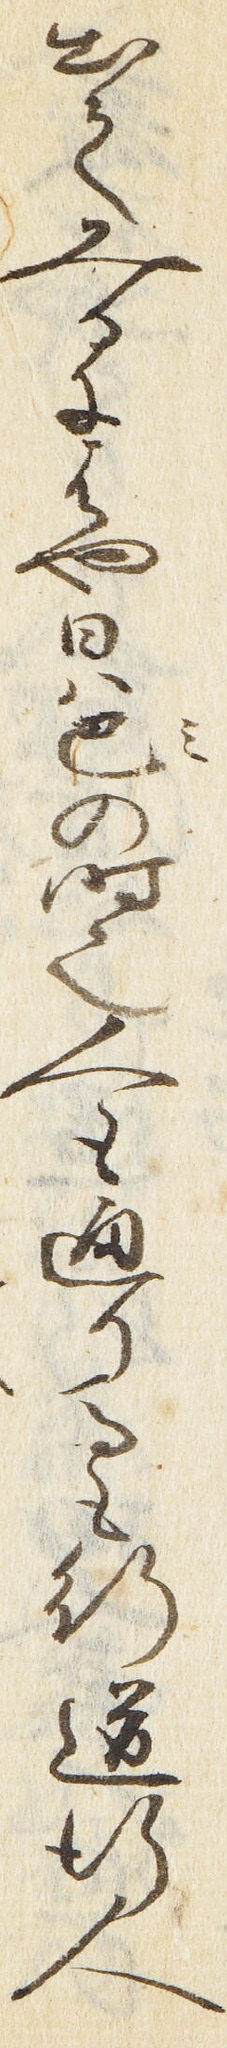出てみるにはや日は巳の時也人も通り馬も行通行人
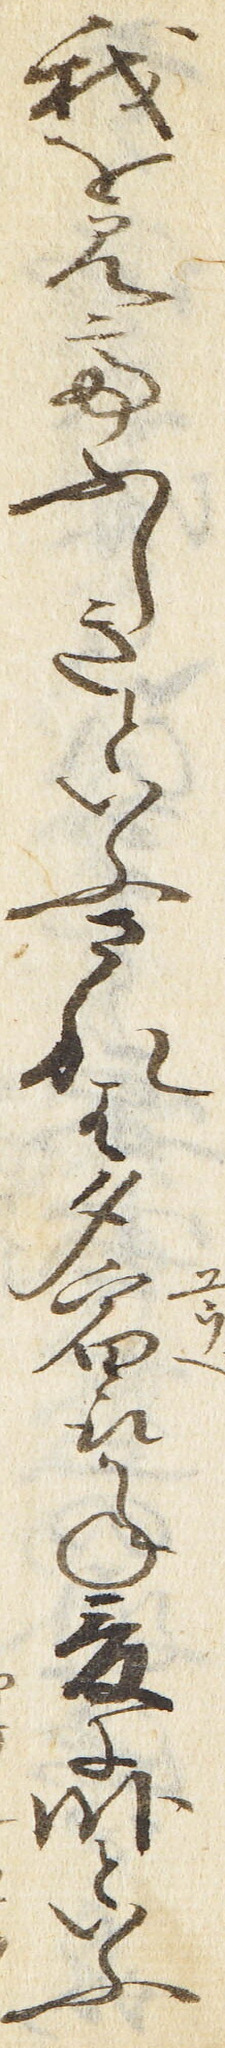我を見てふしきといふされは夕宿取かね爰に臥といふ
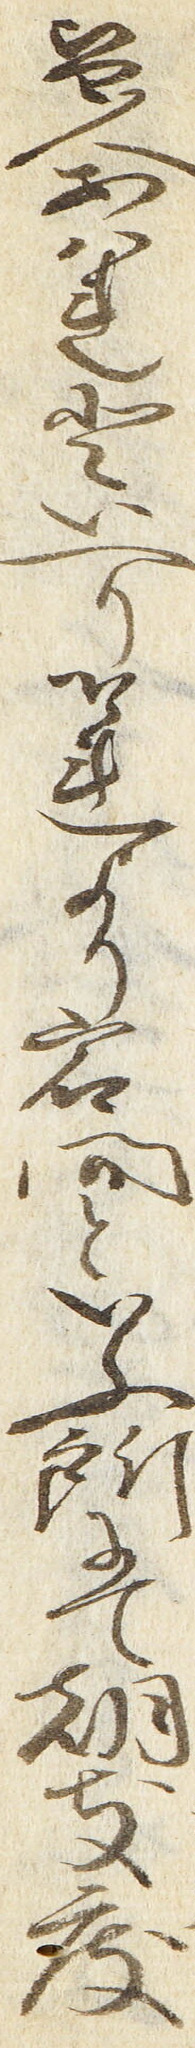皆人あはれといへりそれより岩間といふ所にて朝支度
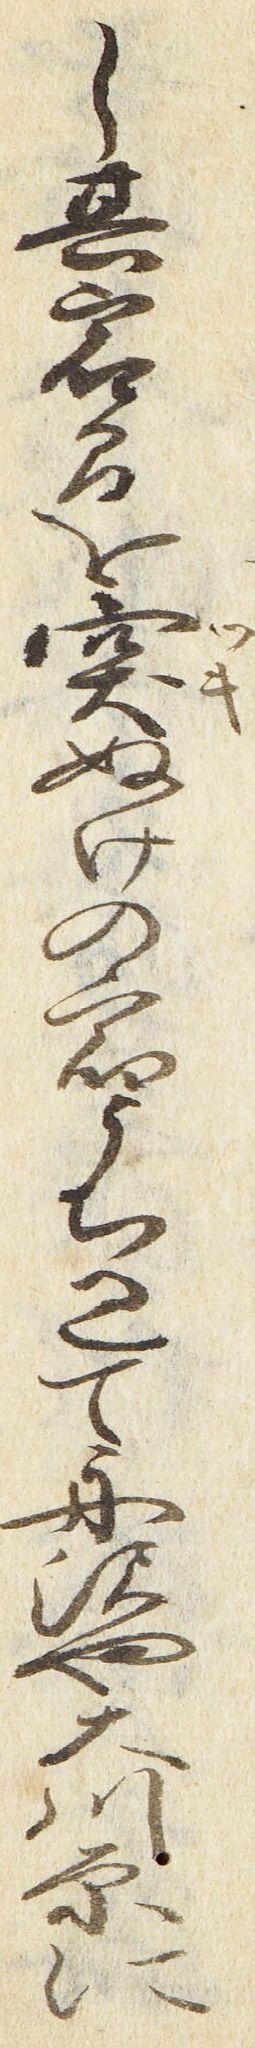し其岩間を突ぬけの宿うち過て舟沢や大川原に

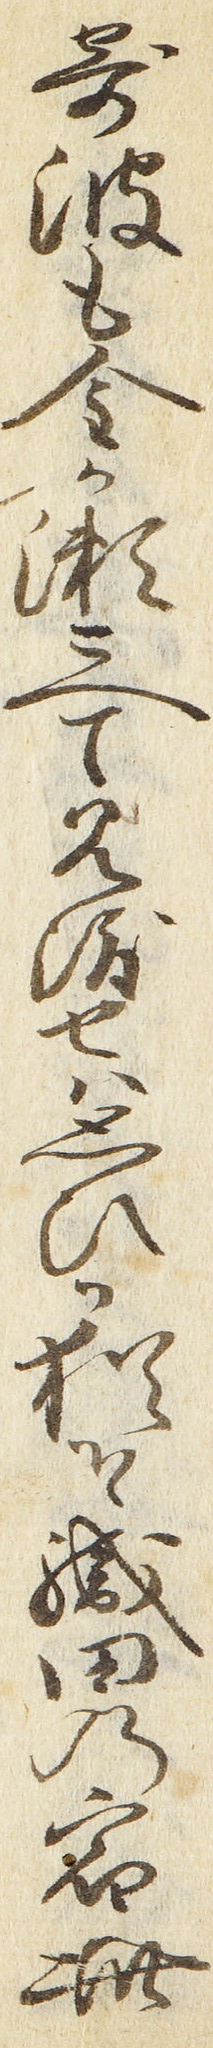寄波も金か瀬こへて見渡せは思ひか猶そ織田の宿此
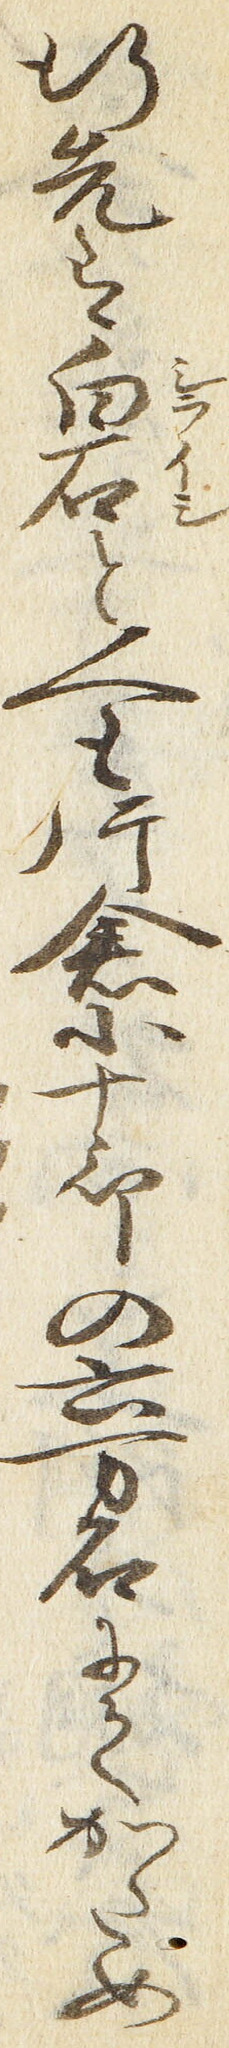行先は白石と人も片倉小十郎の六万石にてかため
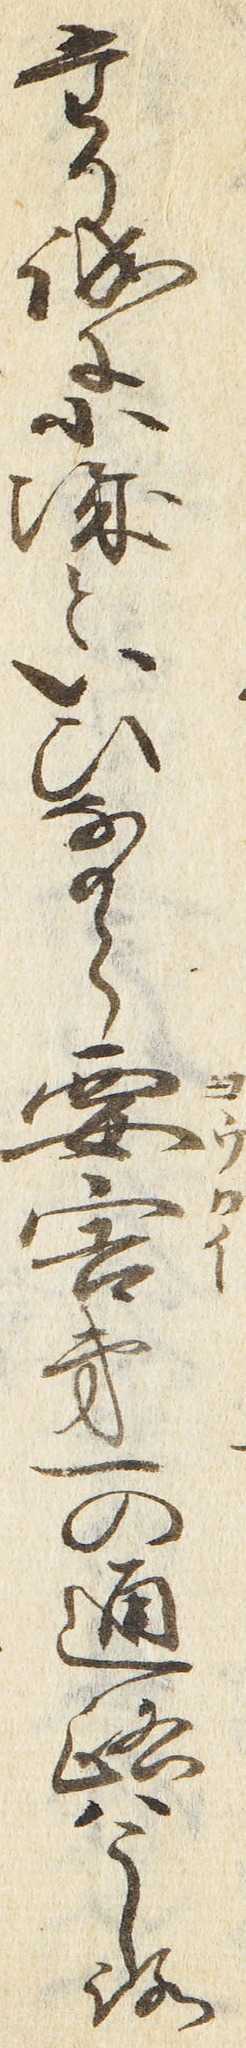たり誠に小城といひなから要害第一の通路はうしろ
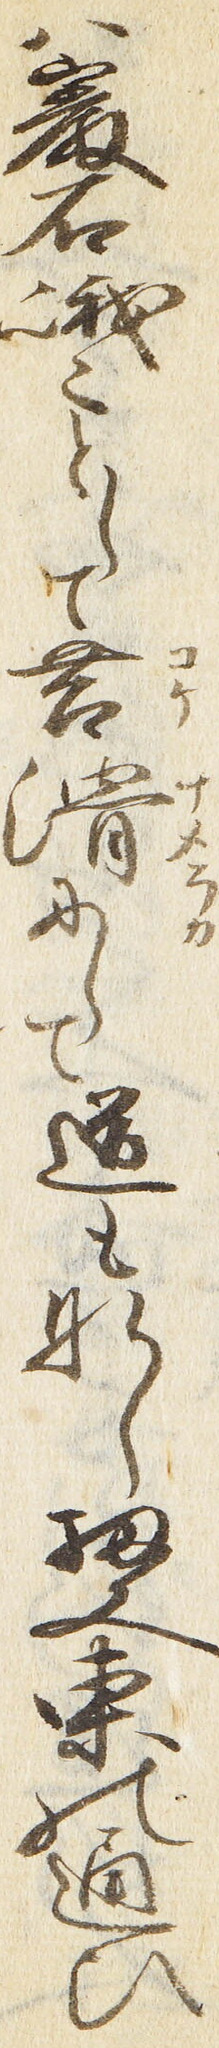ハ巌石峨々として苔滑にして道もなし扨又東の通ひ
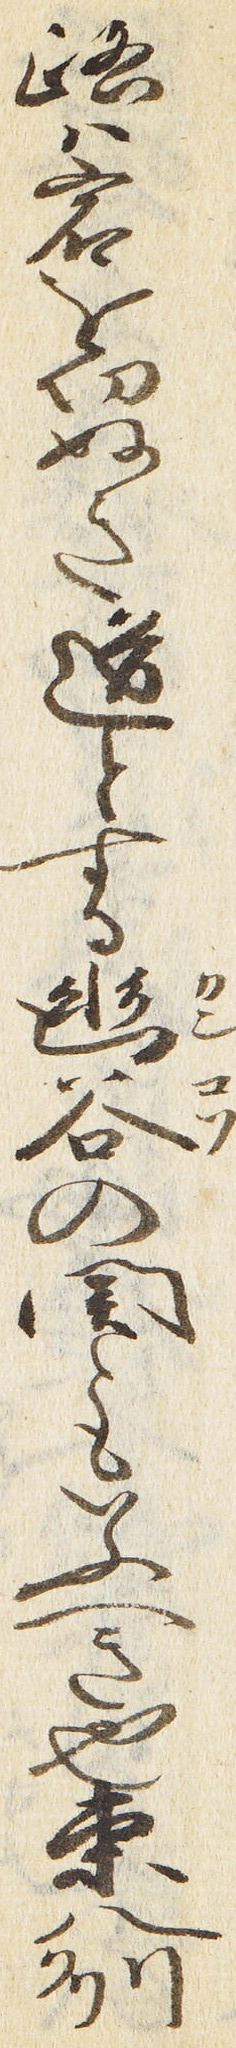路ハ宿を切ぬき道とする函谷の関ともいふへき也東八州
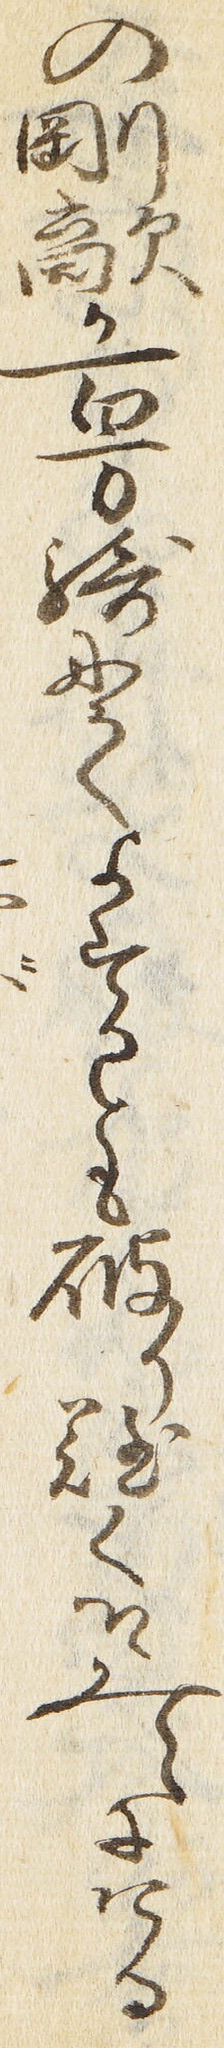の剛敵か百万騎にてよするとも破り難くそみえにける
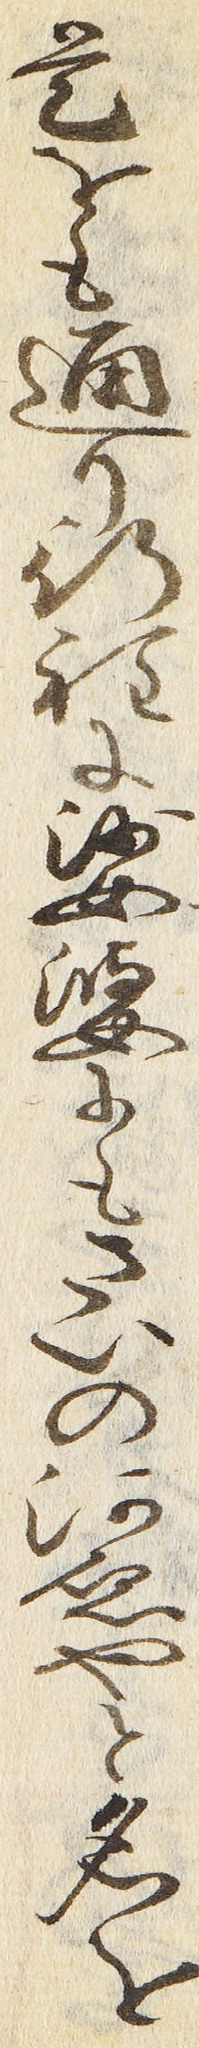是をも通り行程に娑婆にもさいの河原やと名を
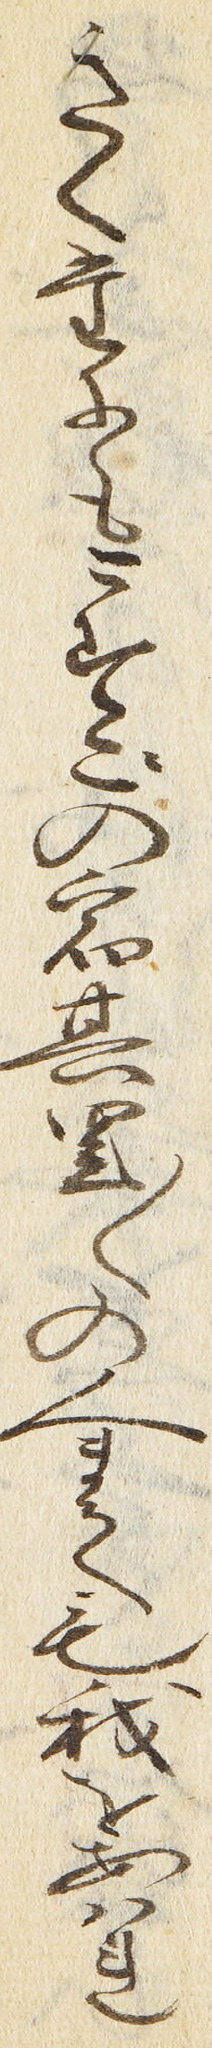きくたにもこすごの宿其里〳〵の人まても我をあはれ
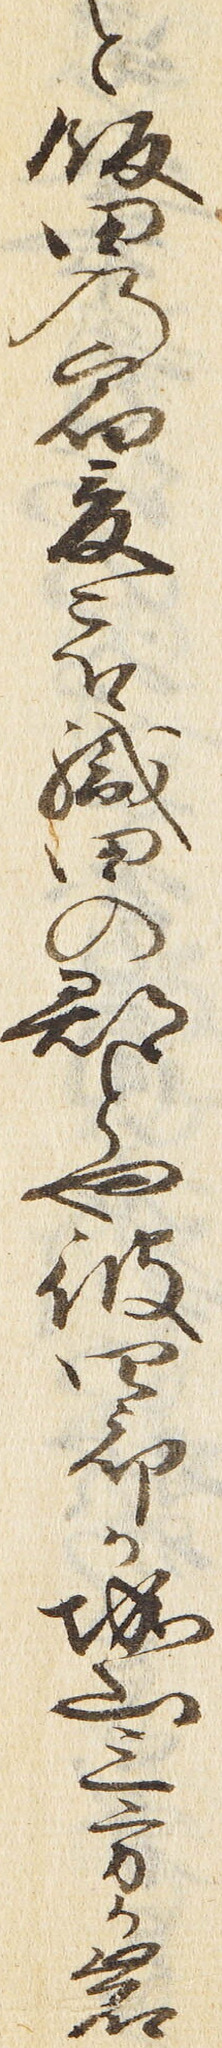と飯田の宿爰こそ織田の郡とや彼四郎か城山三方か岩
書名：海陸世話日記
